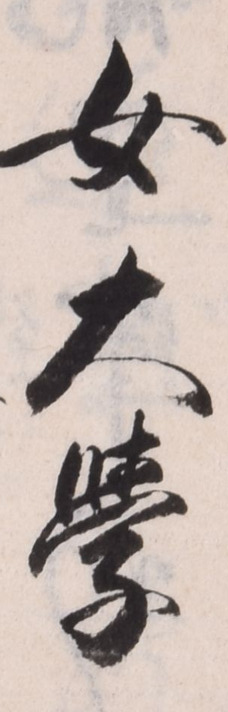女大学
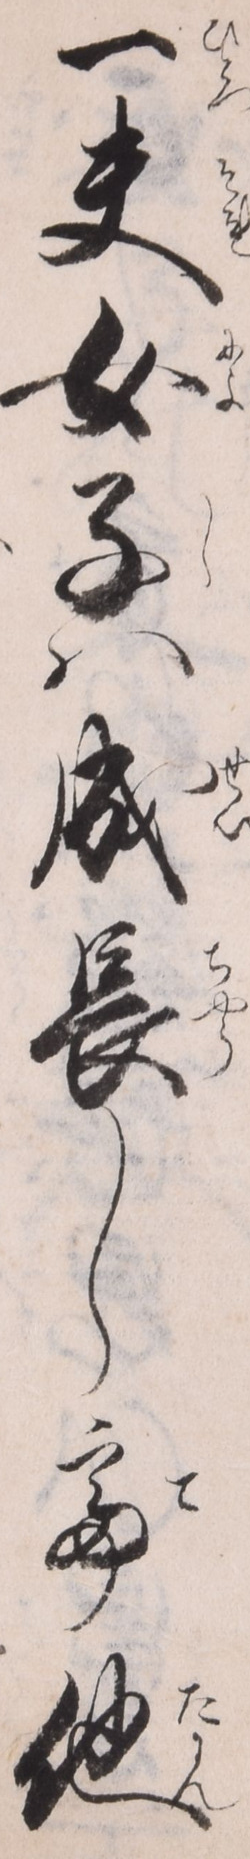一夫女子は成長し亭他
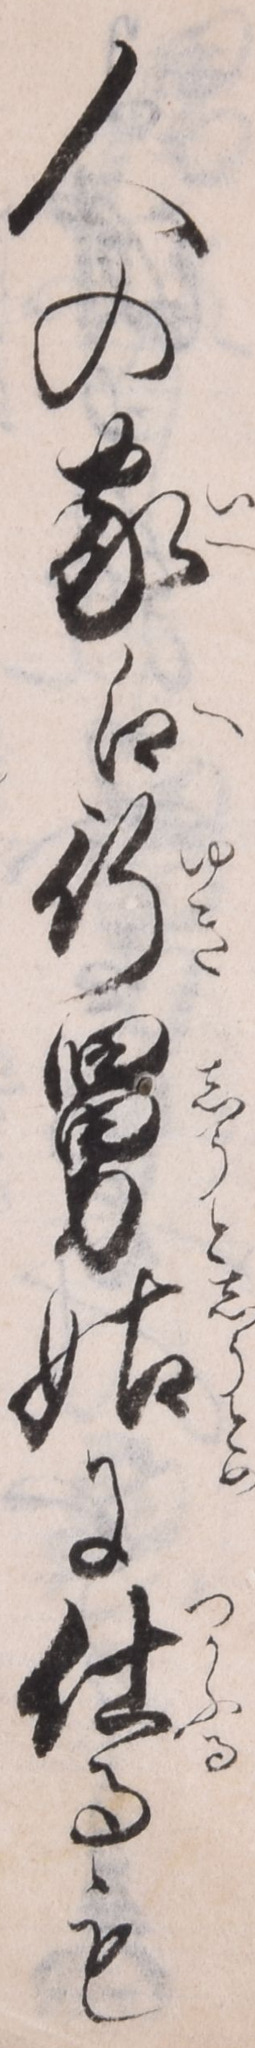人の家江行舅姑に仕るも
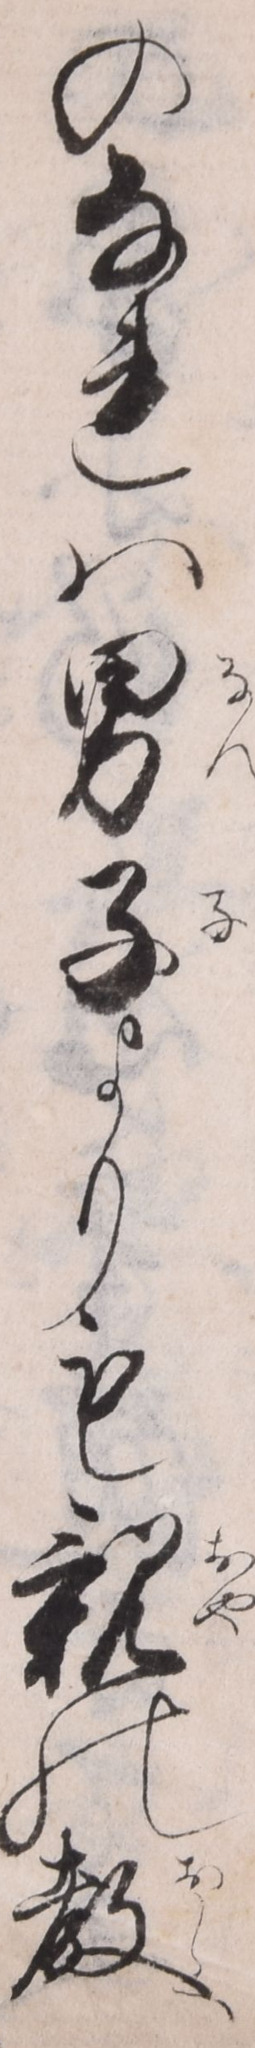のなれは男子よりも親の教
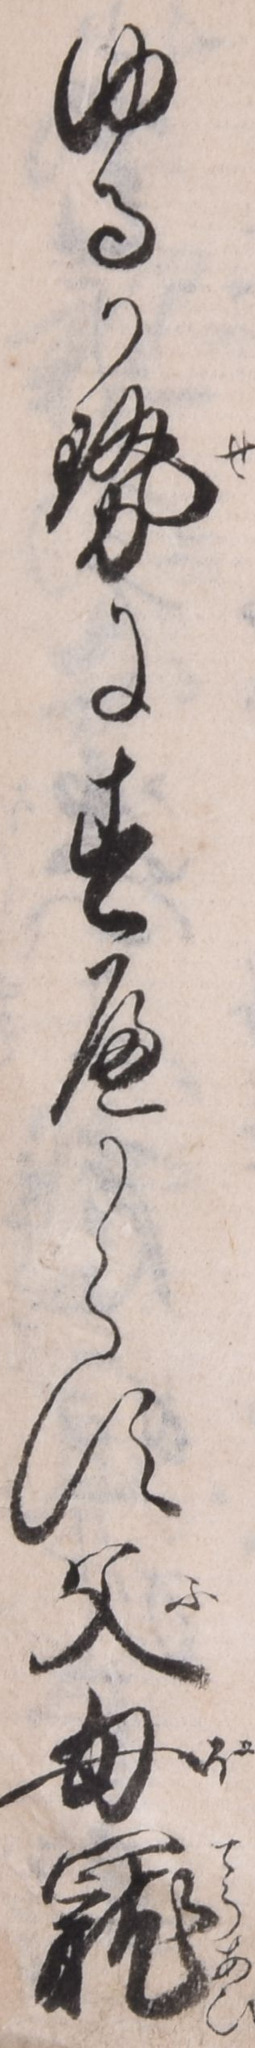ゆるか勢にすへからす父母寵

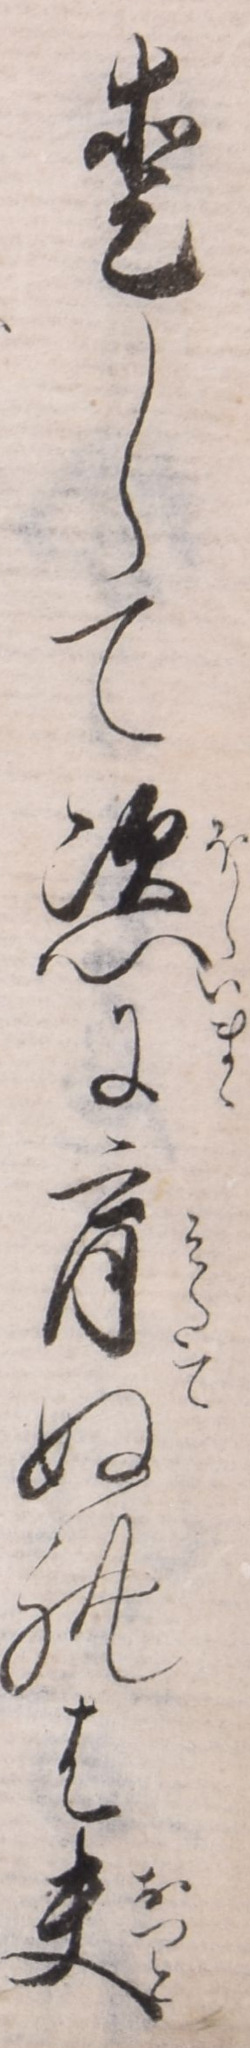愛して恣に育ぬれは夫
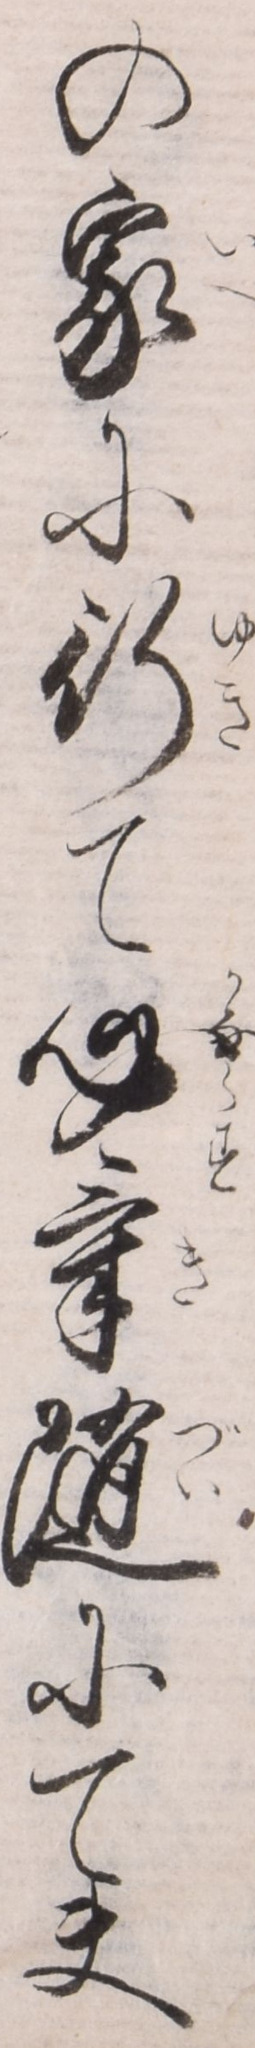の家に行て必気随にて夫
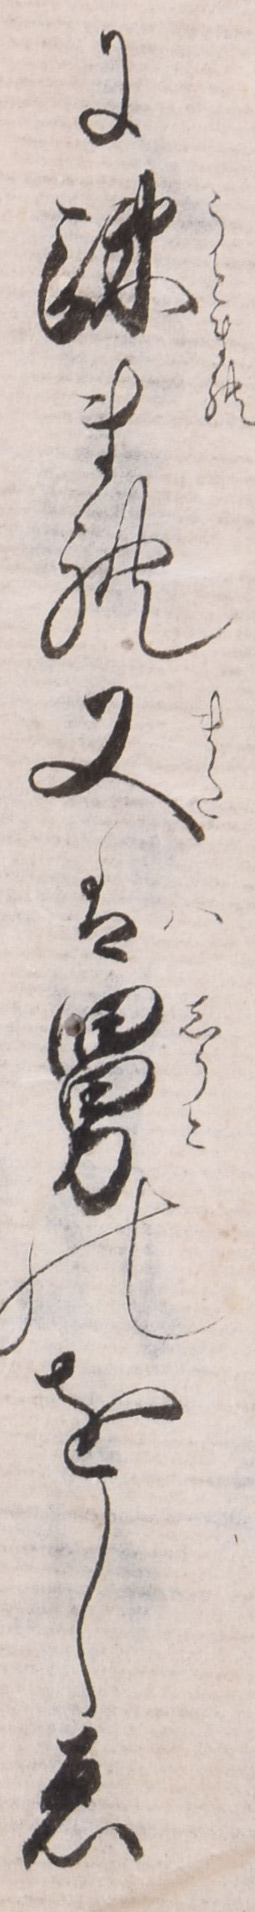に疎まれ又は舅のをしゑ
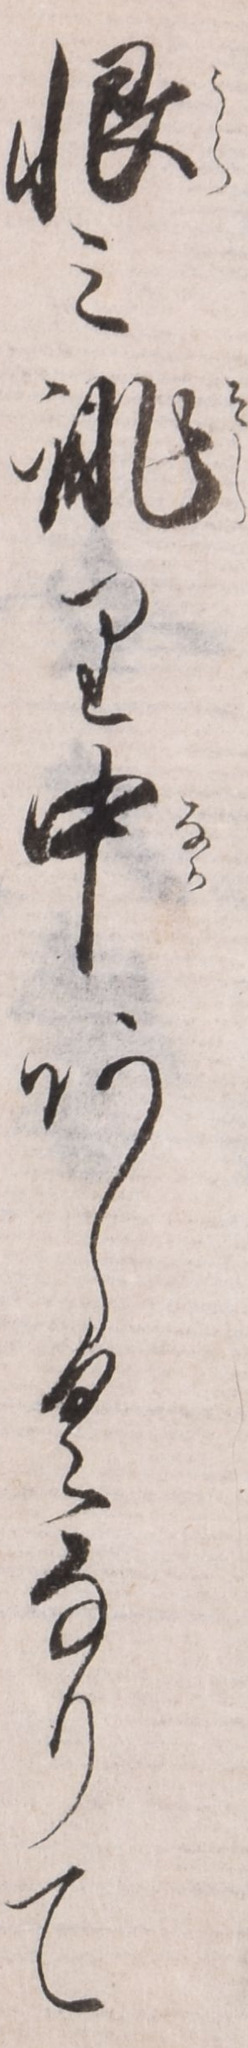恨み誹り中あしくなりて
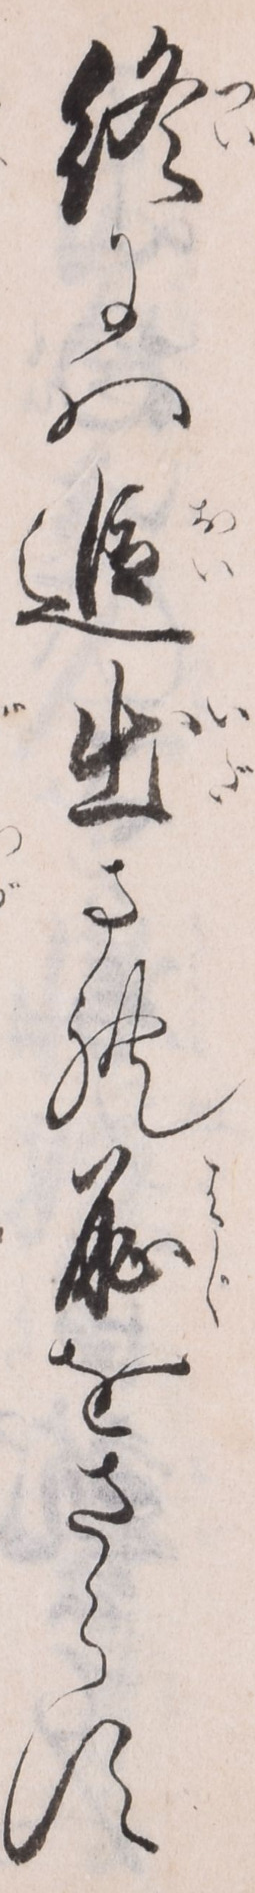終には追出され恥をさらす
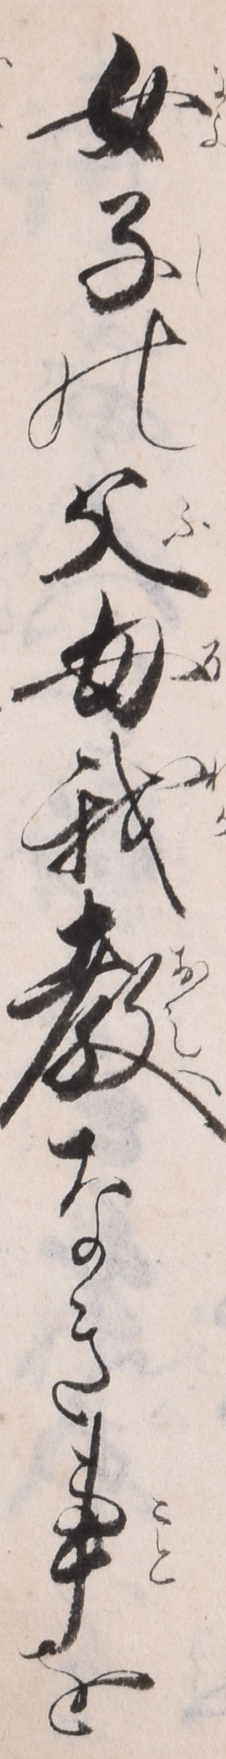女子の父母我教なき事を
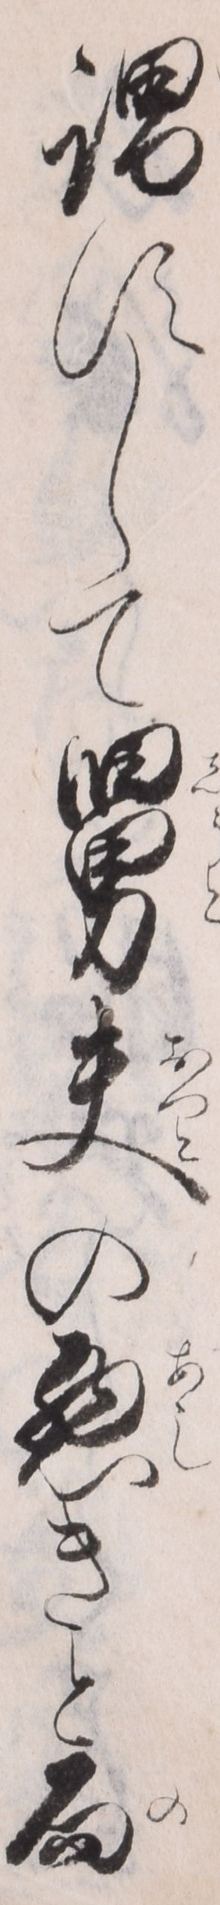謂すして舅夫の悪きと而
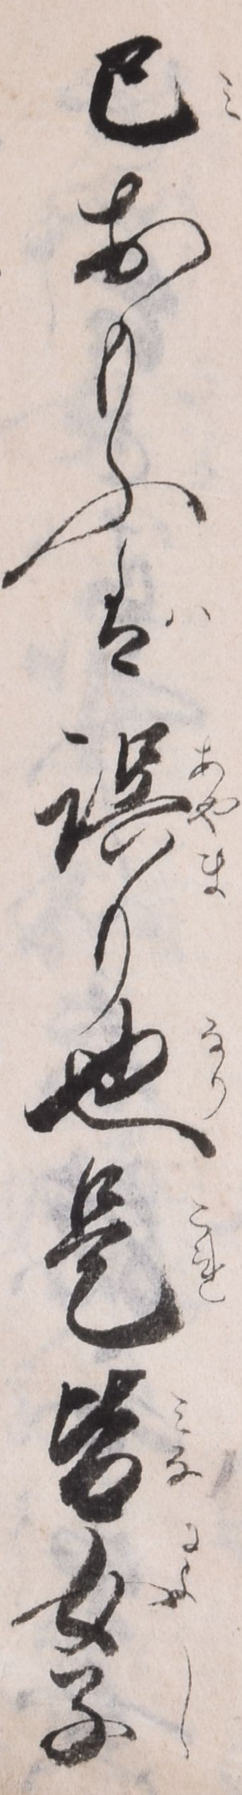已おもふは誤り也是皆女子
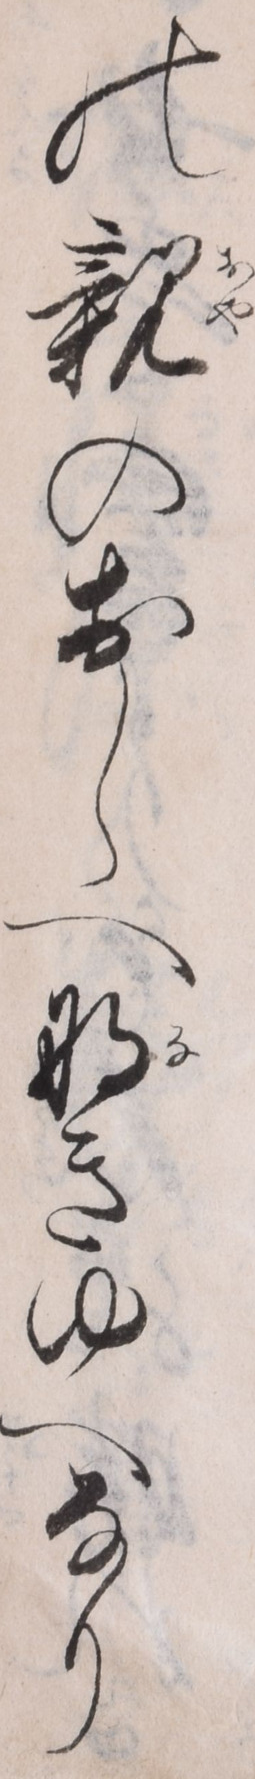の親のおしへ那きゆへなり

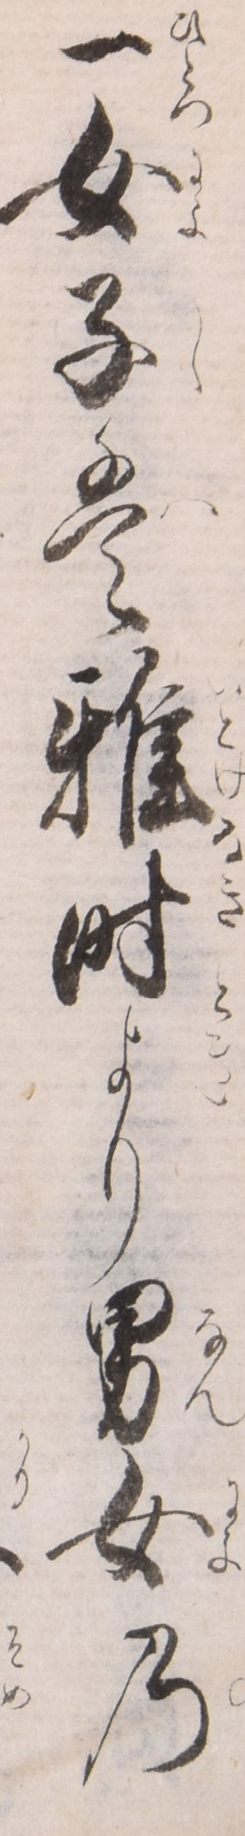一女子は稚時より男女乃
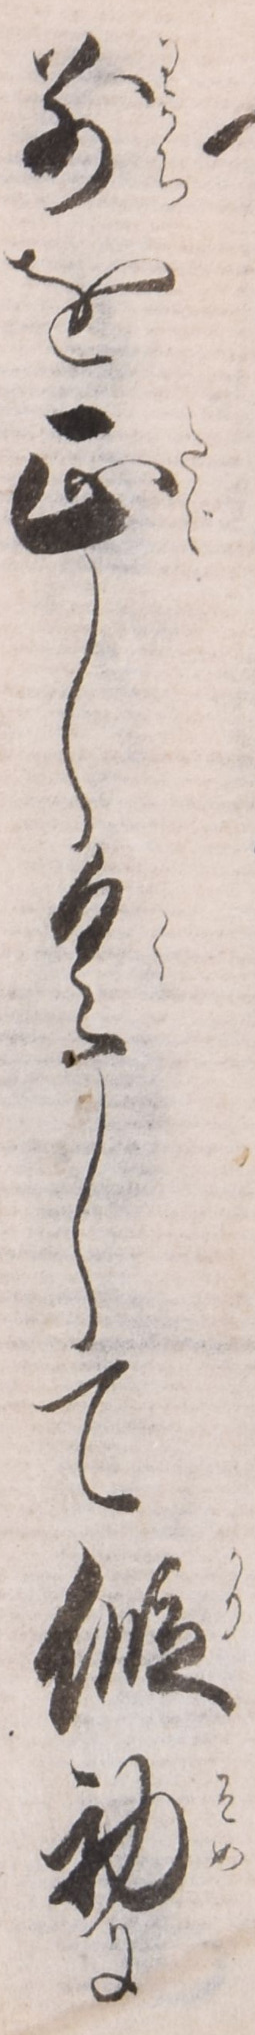別を正し具して仮初に
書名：女子
